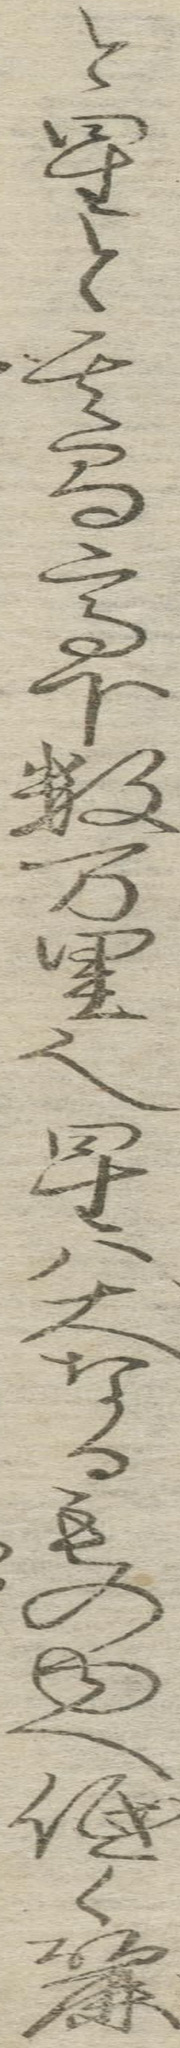と星と其間高下数万里也星は大なるものゆへ低く麗
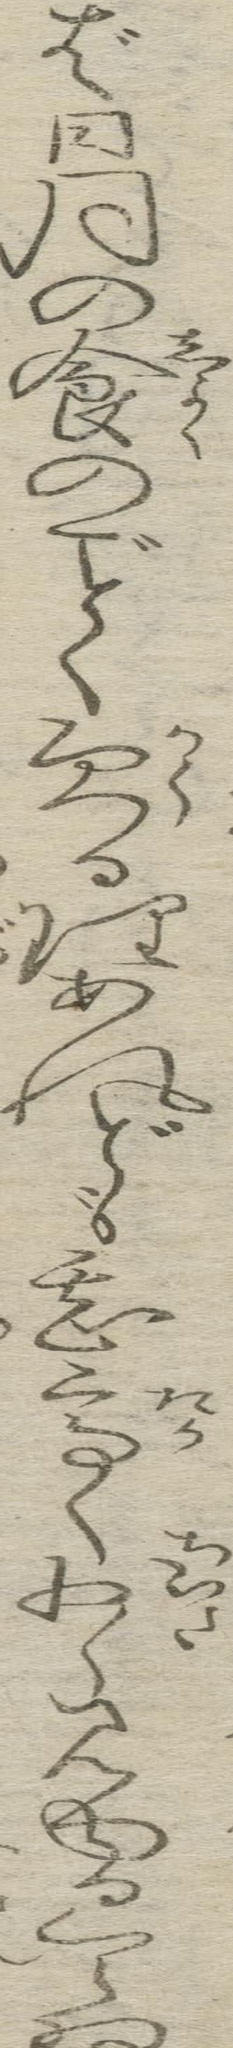ば日月の食のごとく欠る理あれども甚高く小く見ゆるくらゐ
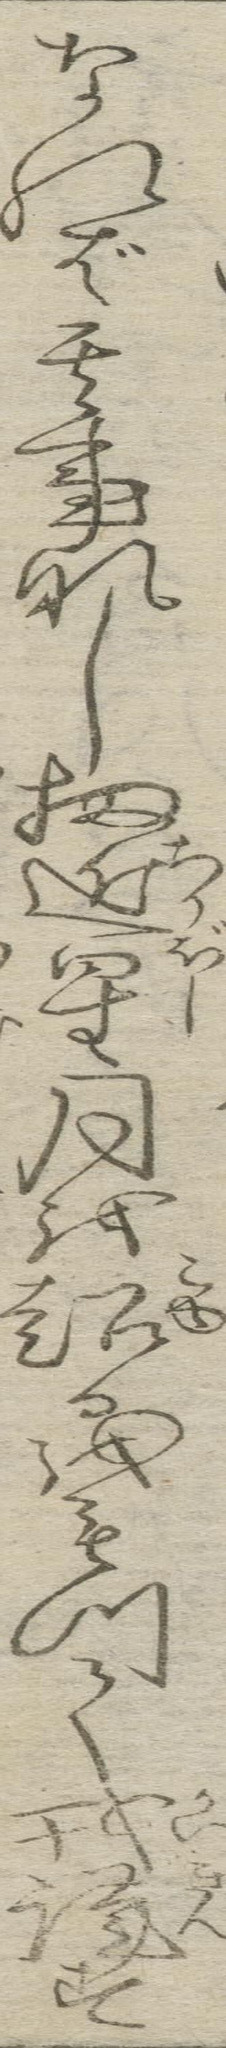なれば其事なし扨近星月を超るをもつて戒？謹す
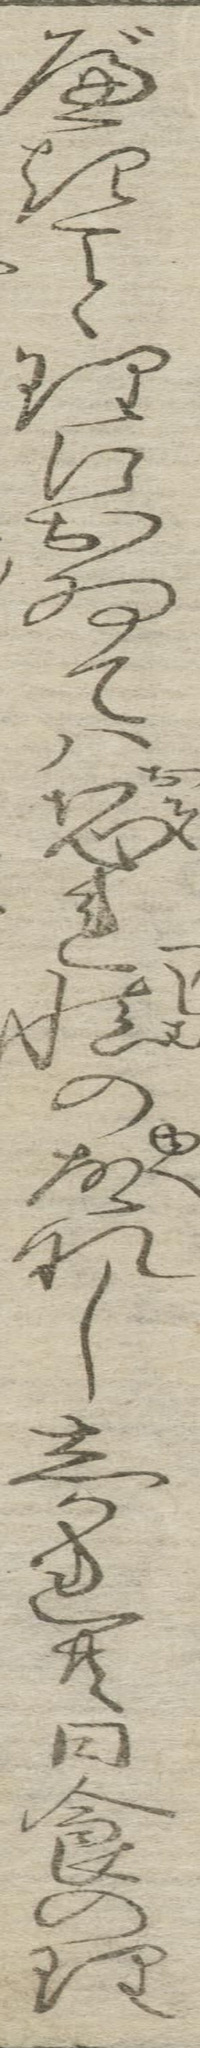べきこと理におゐては恐れ慎の故なししかれ共日食の理
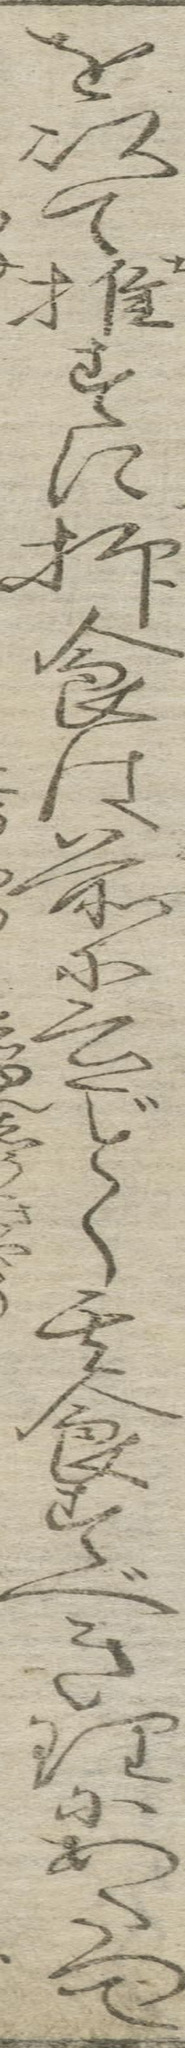を以て推すに抑食は前に云ごとく其食すべき理にあたつて
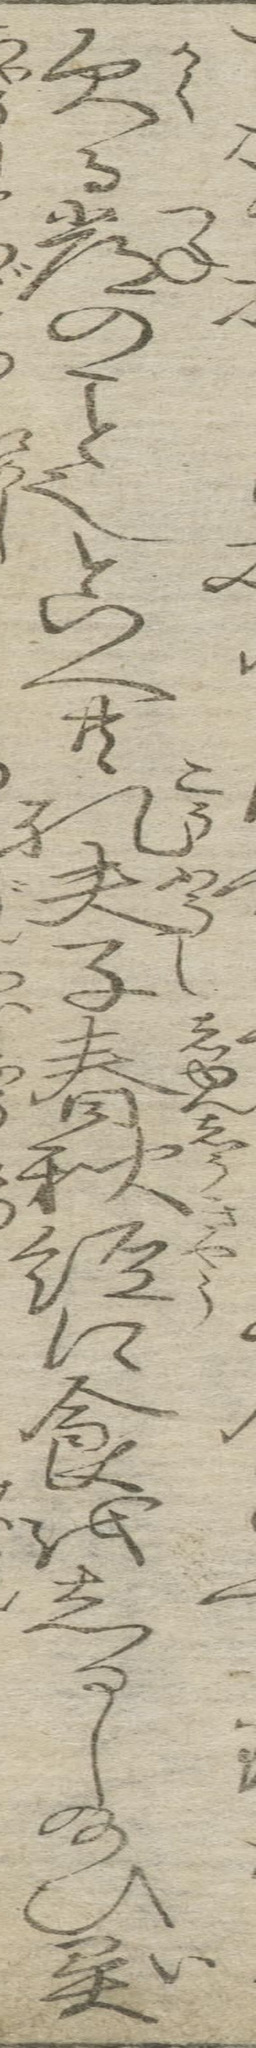欠る常のこと也といへ共孔夫子春秋経に食をしるし給ひ異
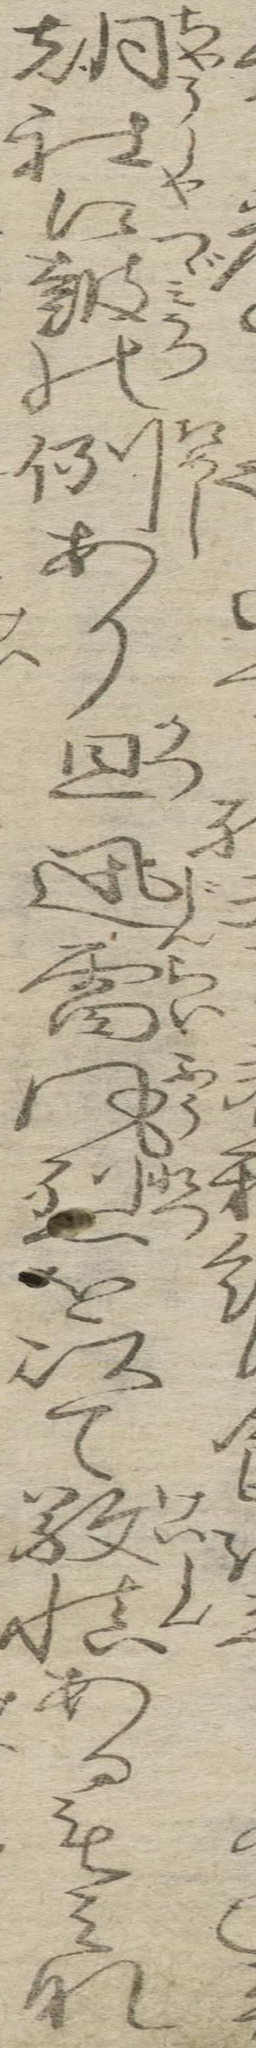朝社に鼓の例あり且迅雷風烈を以て敬慎あるもみな
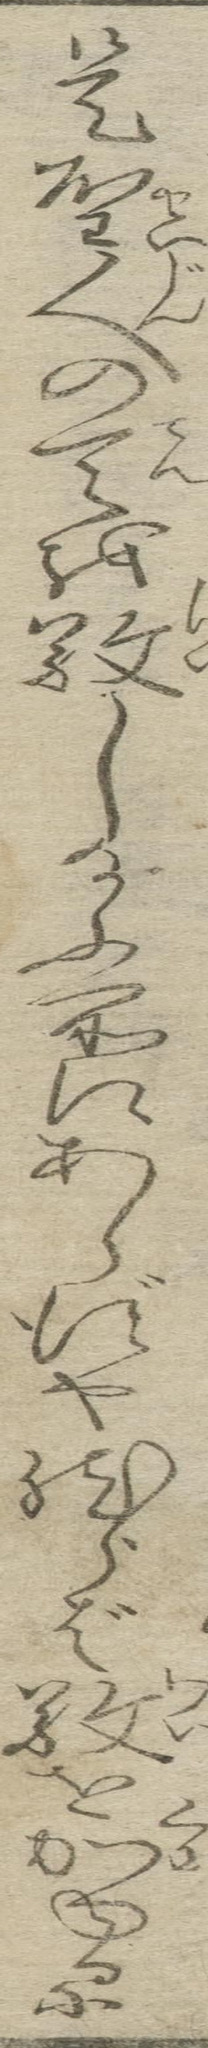是聖人の天を敬し給ふ所にあらずや然らば敬を加ゆるに

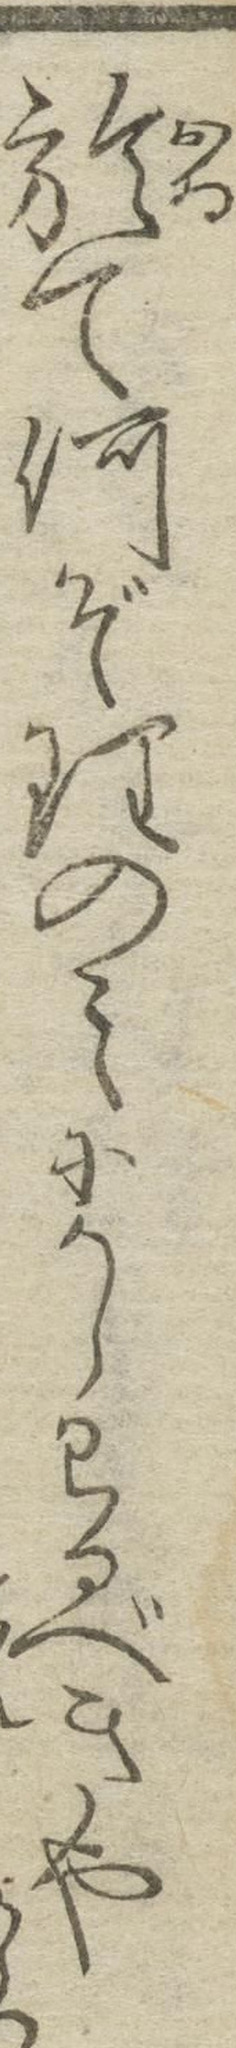於て何ぞ理のみにかゝわるべきや
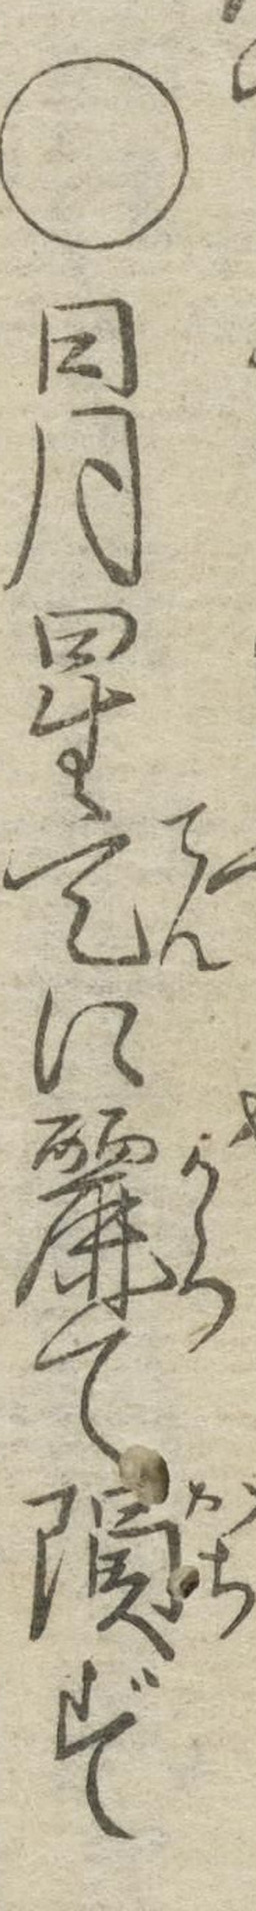○日月星天に麗て隕ず
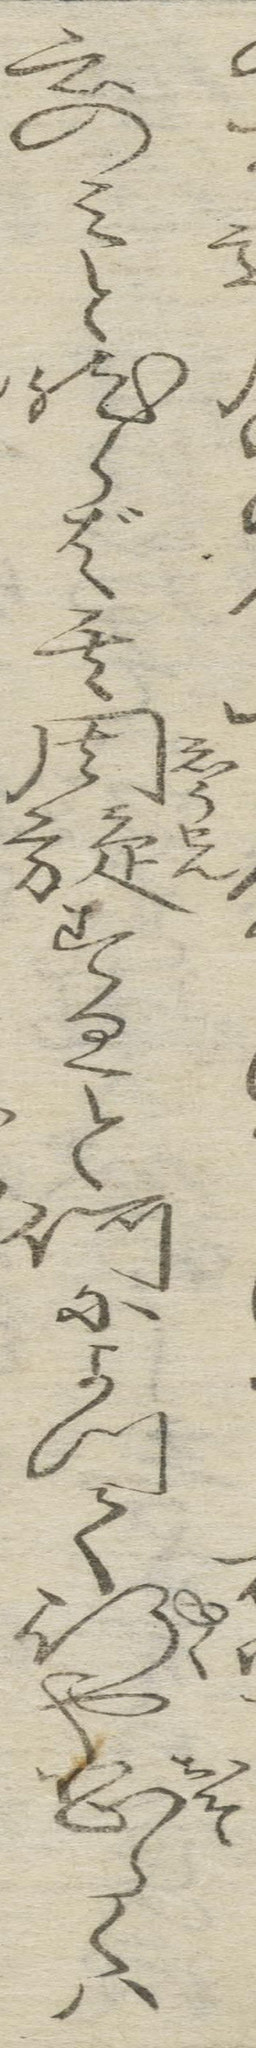云のみと然らば其周旋すること何によつて行や恐らくは
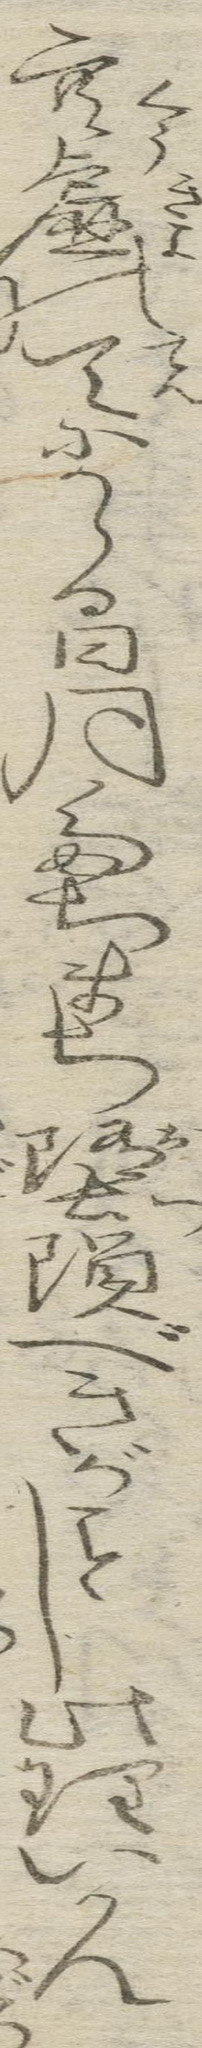空虚の天にかゝる日月たちまち堕隕べきがことし此理いかん
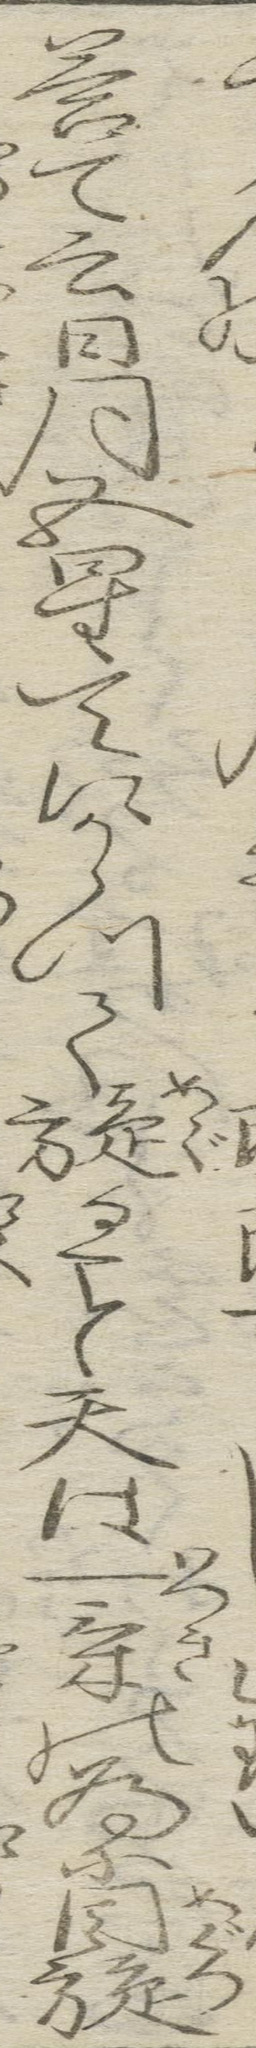答て云日月五星天にかゝつて旋ること天は一気の為に周旋
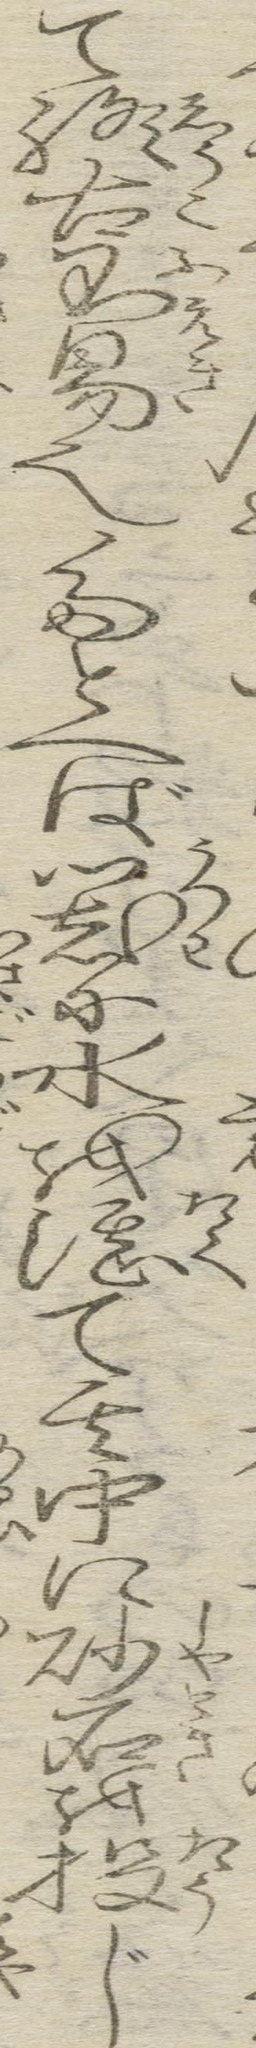て終古不易也たとへば器に水を湛て其中に砂石を投じ
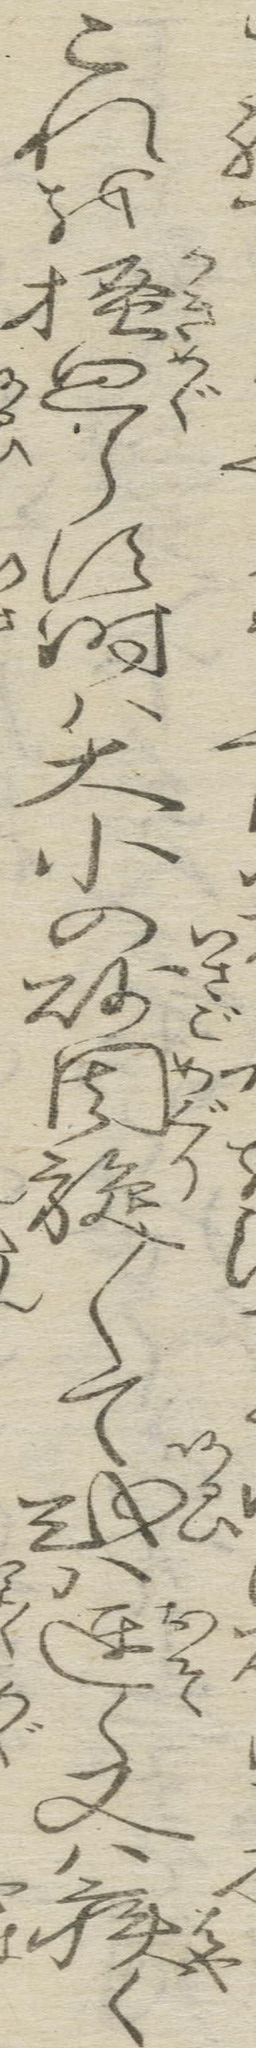これを掻廻らす時は大小の砂周旋〳〵て或は遅く又は疾く
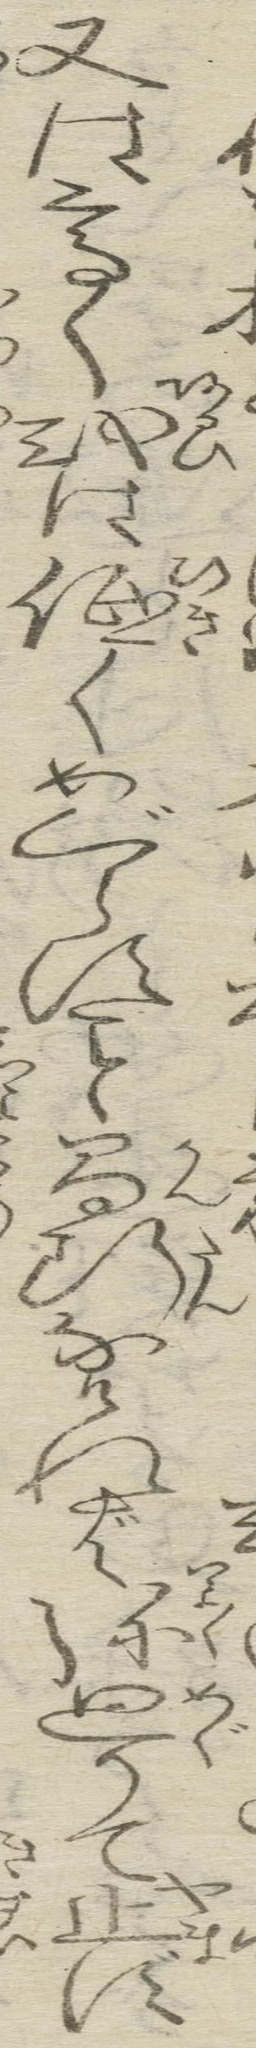又は高く或は低くめぐらすこと間断なければ弥廻りて止ず
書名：訓蒙天地辨　天
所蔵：東京大学地震研究所図書室 Earthquake Research Institute Library, The University of Tokyo, JAPAN
